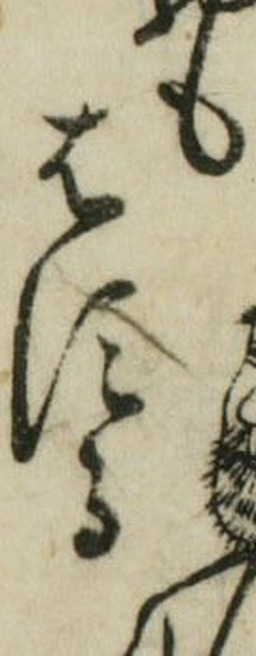はする
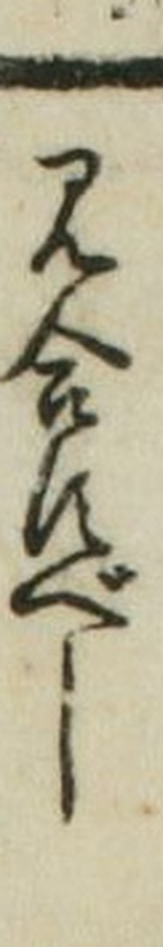見合すべし
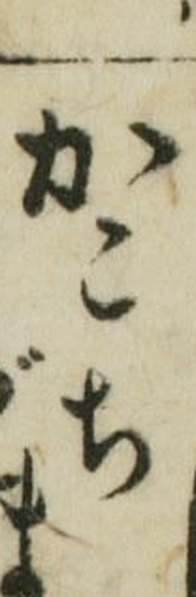かこち
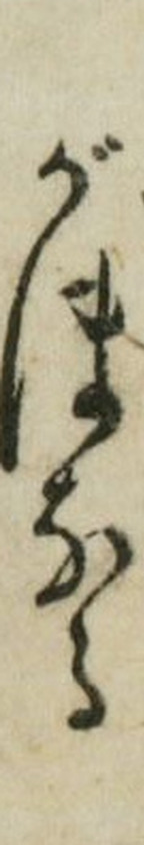がほなる
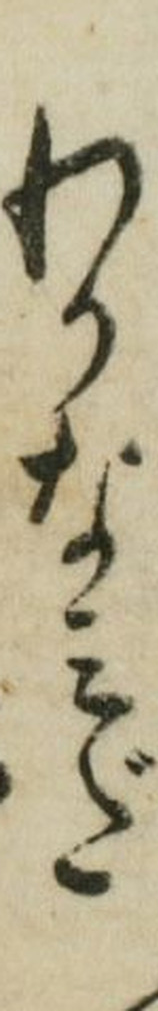わかなみだ
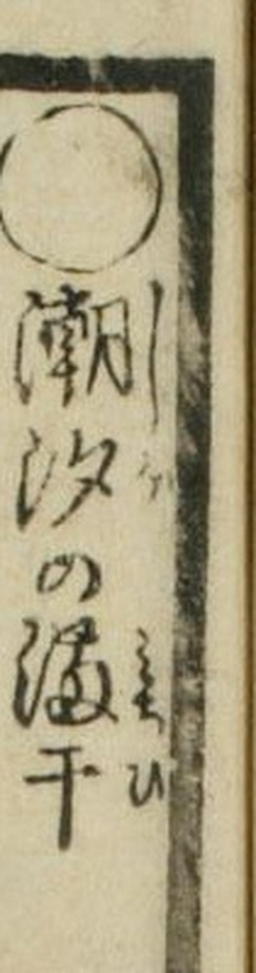○潮汐の満干
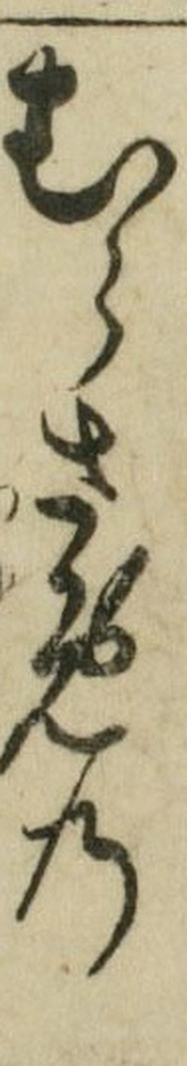むらさめの
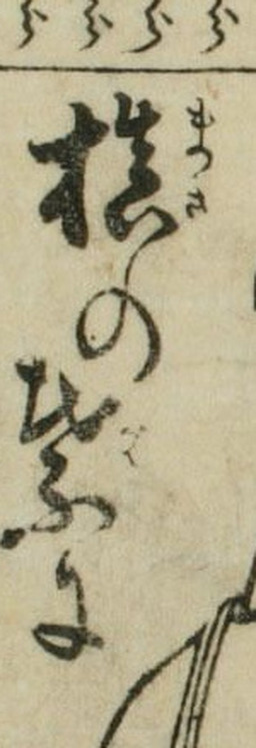槙の葉に
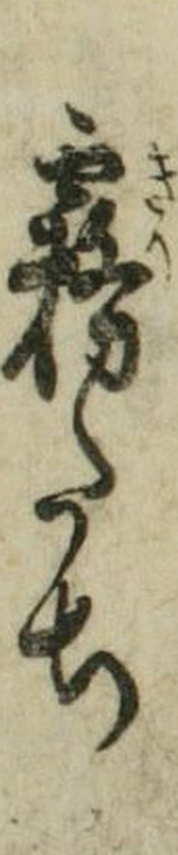霧たち
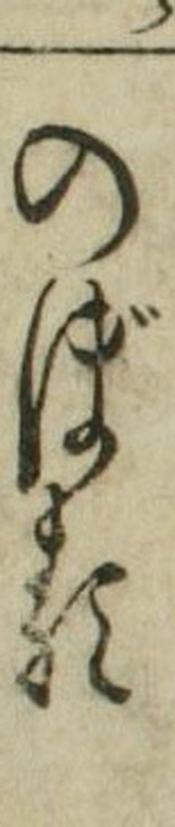のぼる
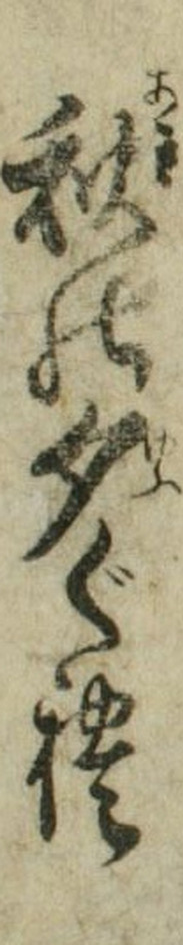秋の夕ぐれ

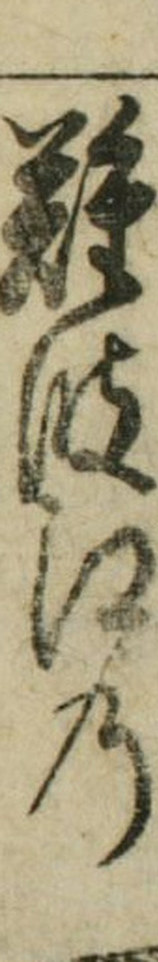難波江の
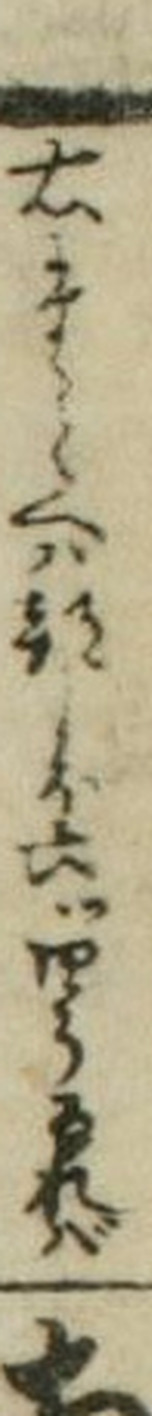右にたとへは朝しほ六ツ四分なれば
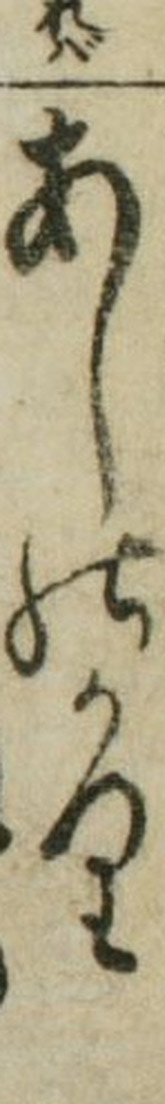あしのかり
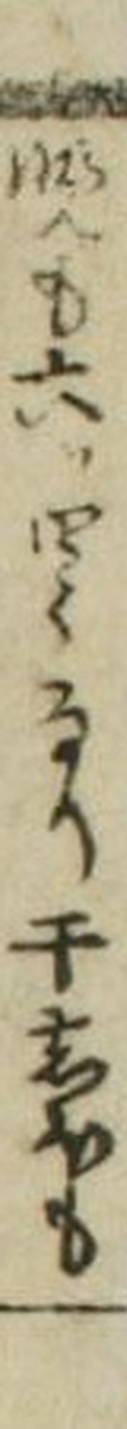晩も六ツ四となり干しほも
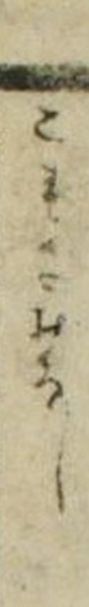これにおなし
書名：百人一首
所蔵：東京学芸大学教育コンテンツアーカイブ
